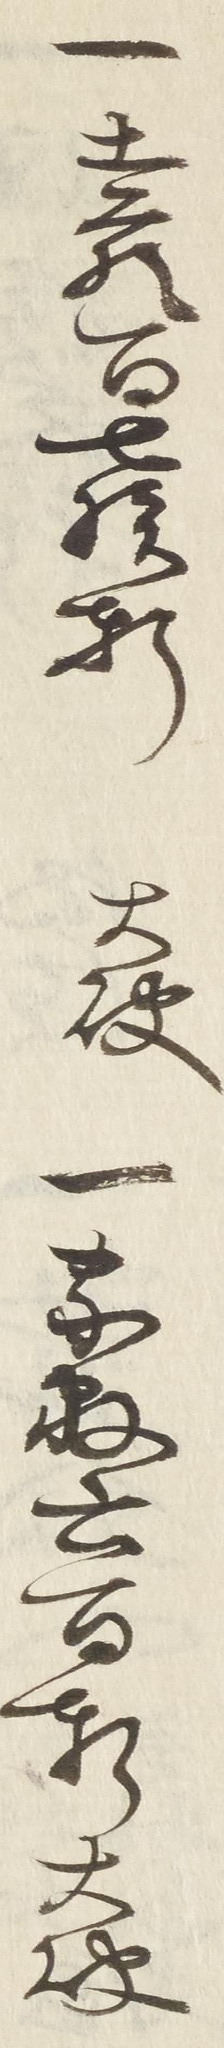一土蔵百七拾軒大破一家数六百軒大破
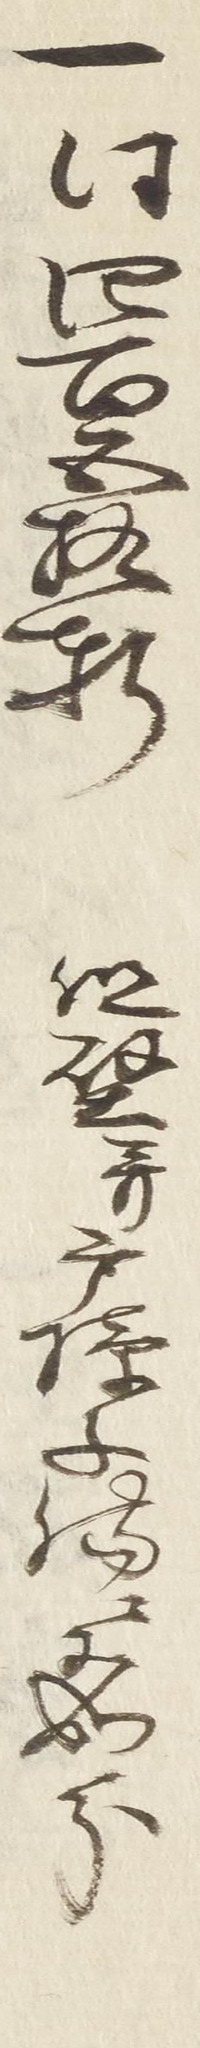一同四百五拾軒但壁并戸障子傷に相成分
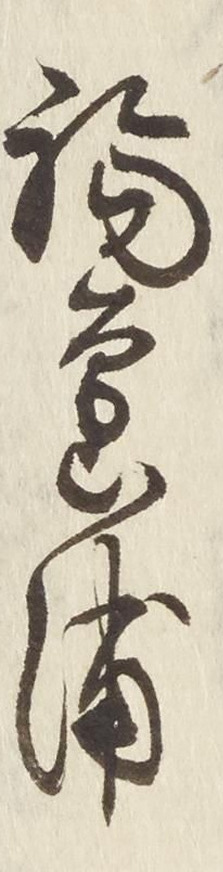福嶋浦
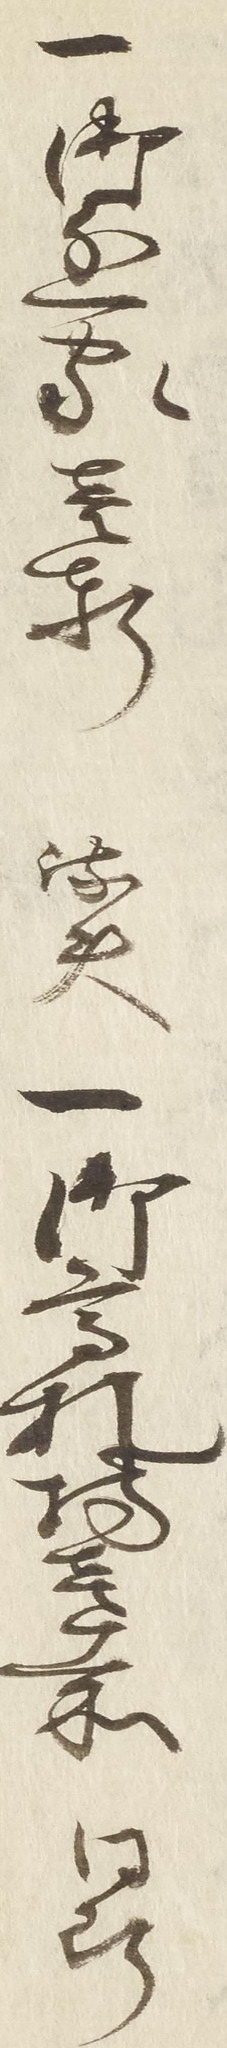一御分一家壱軒流失一御高札場壱ヶ所同断
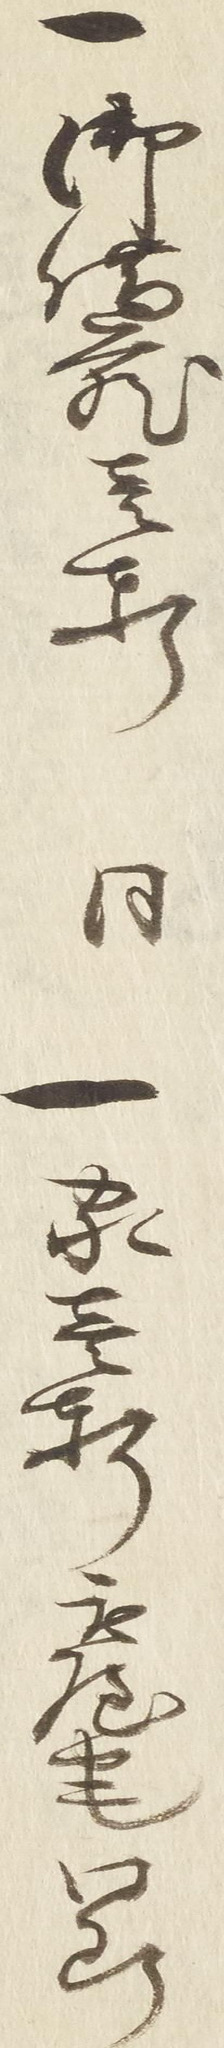一御借蔵壱軒同一家壱軒庄屋宅同断
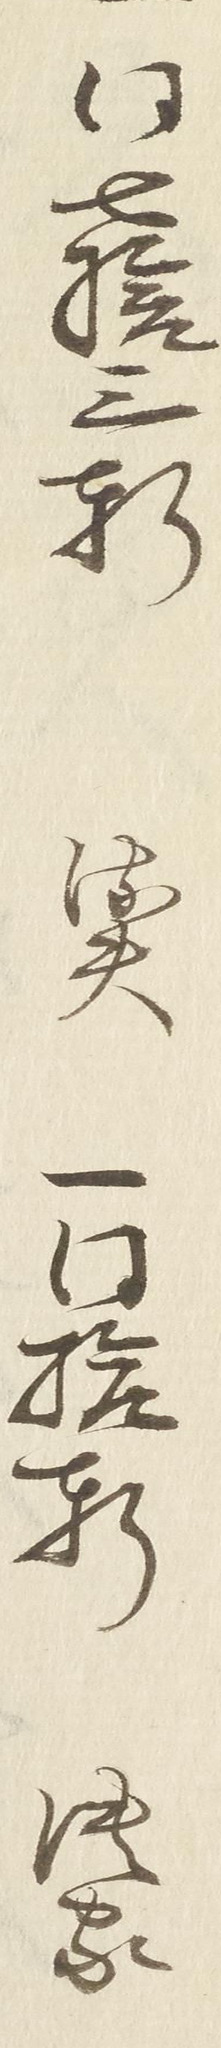一同七十三軒流失一同拾軒潰家
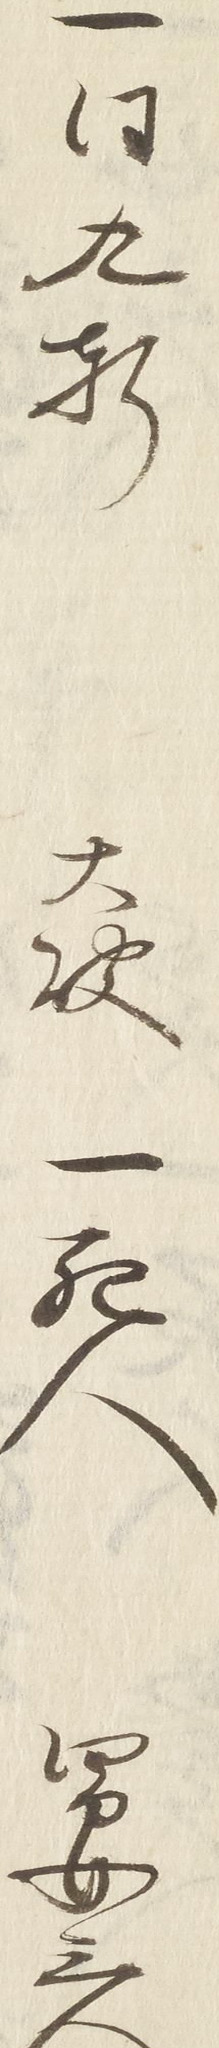一同九軒大破一死人男女三人
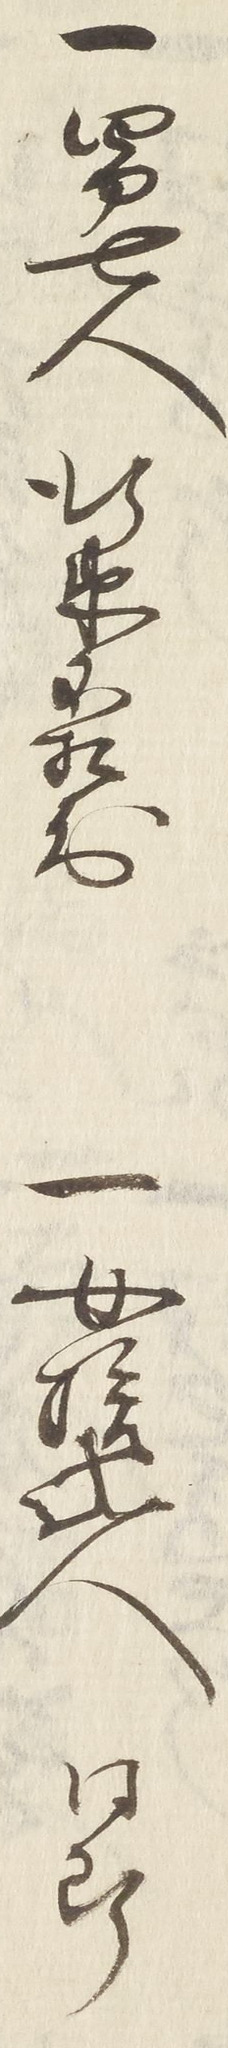一男七人行衛不相知一女拾弐人同断
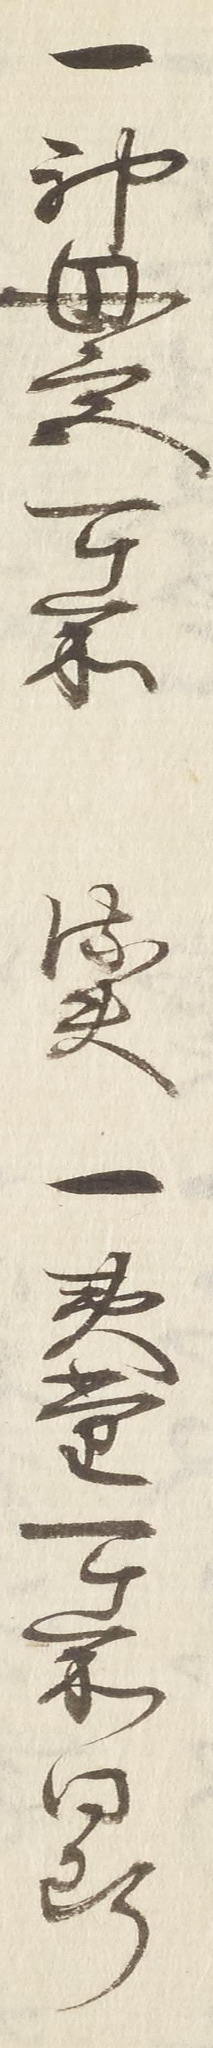一神母宮一ヶ所流失一夷堂一ヶ所同断
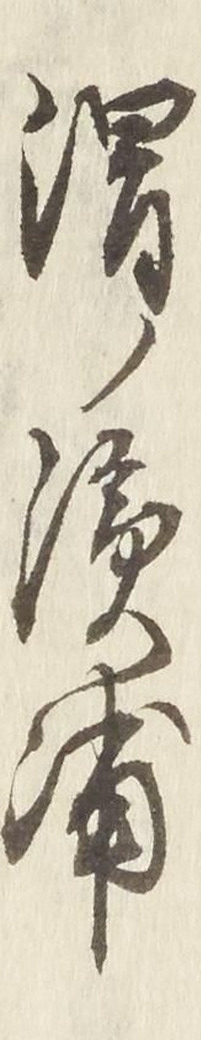渭ノ浜浦
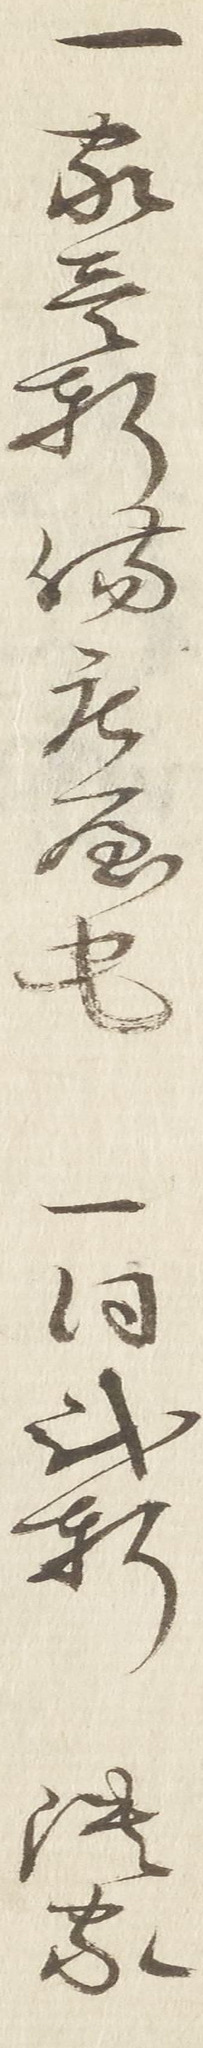一家壱軒傷庄屋宅一同弐軒潰家
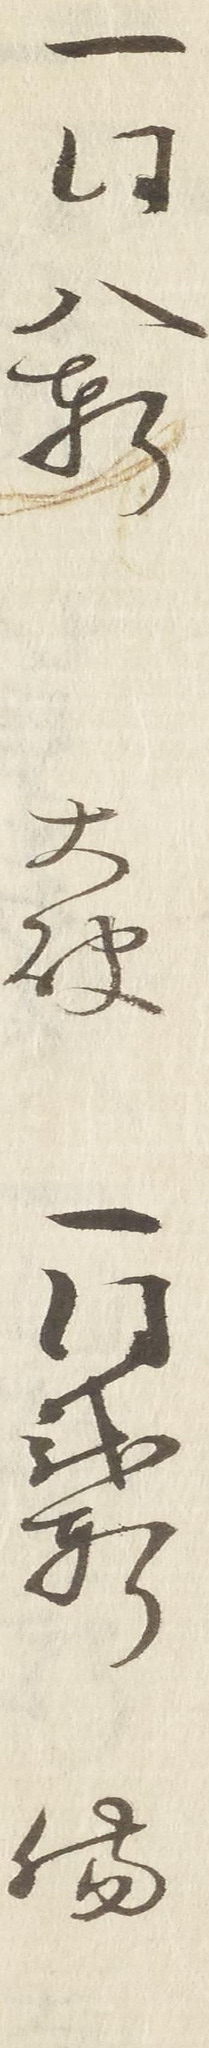一同八軒大破一同弐軒傷
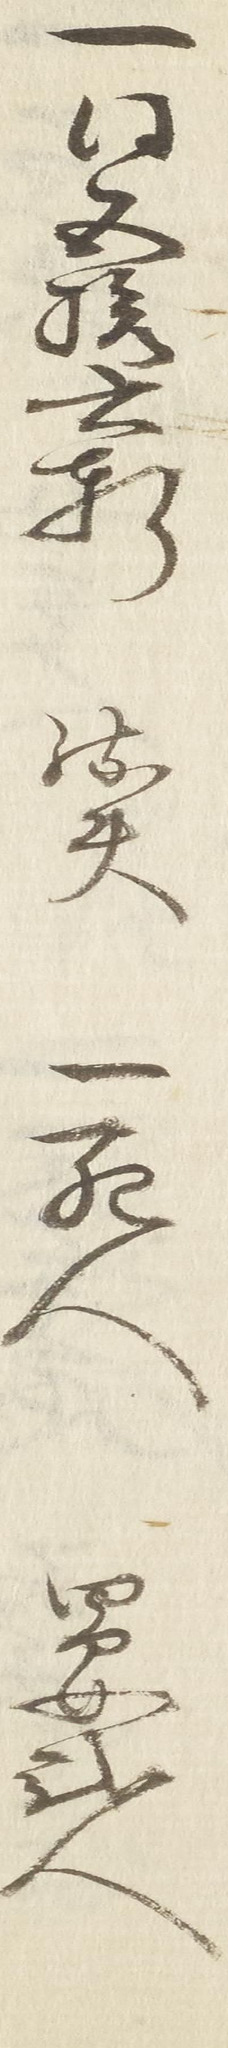一同五拾六軒流失一死人男女弐人
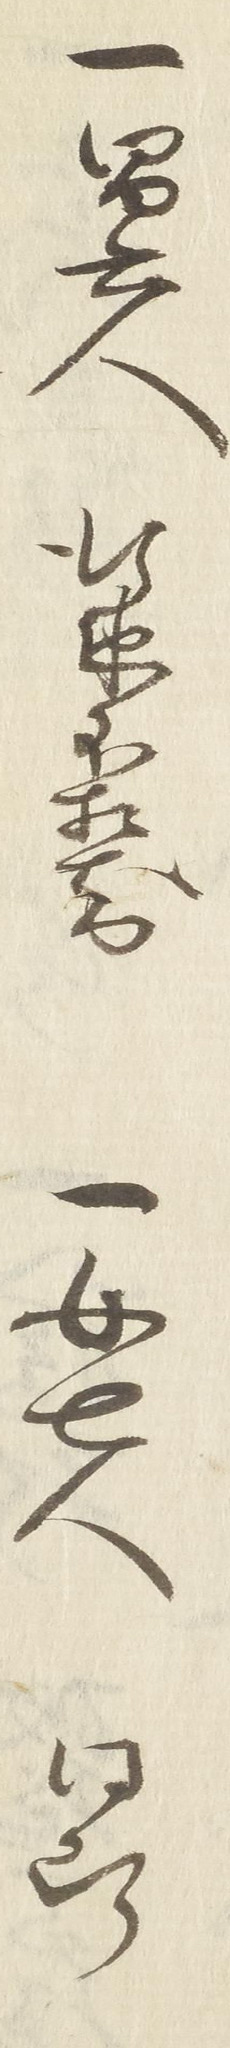一男六人行衛不相知一女七人同断
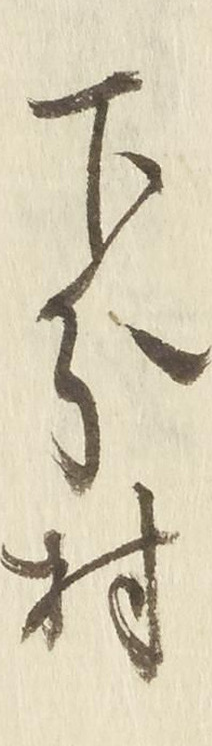下分村

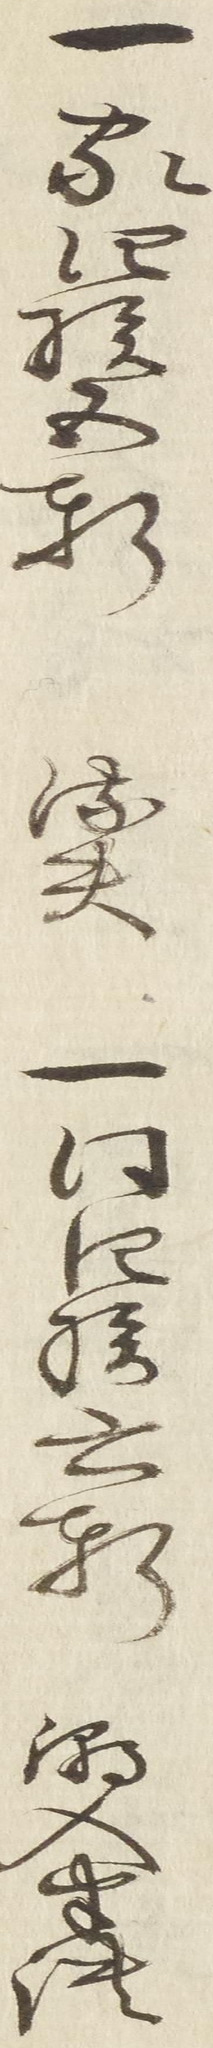一家四拾五軒流失一同四拾六軒潮入半潰
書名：地震記　下
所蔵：東京大学地震研究所図書室 Earthquake Research Institute Library, The University of Tokyo, JAPAN
